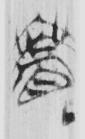{舛亼几日}
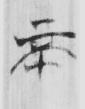不
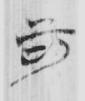可
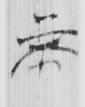不
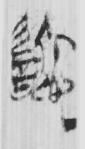{糸言斤心}
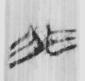非
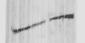一
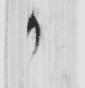人
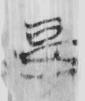是
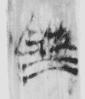爲
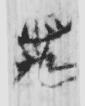萬
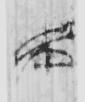民
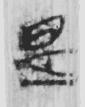是
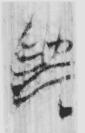爲
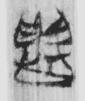𪴿
